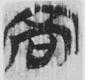高
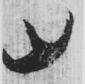山
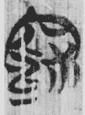深
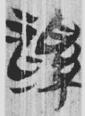溪
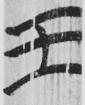王
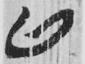㠯（以）
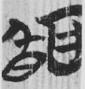䎽（問）
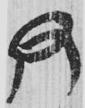尹
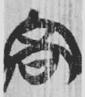高
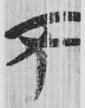不
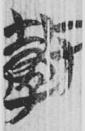穀
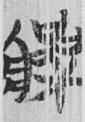○（懆）
